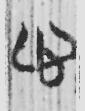心
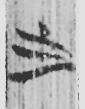之
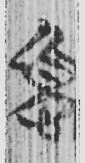𢝊（憂）
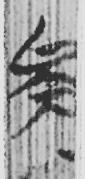矣
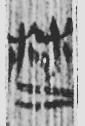{𣏟止}
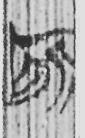所
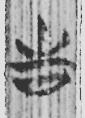告
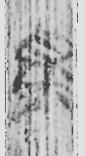眔
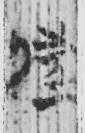{人㞷}
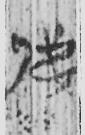俤
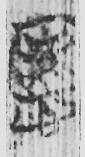慝
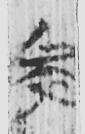矣
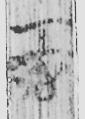{工心}
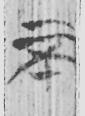不
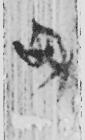和
